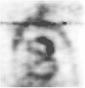宮
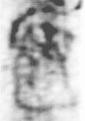廏
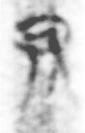尹
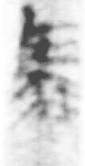馭（御）
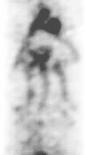安
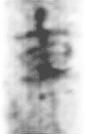車
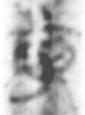革
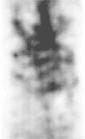兼
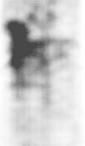軒
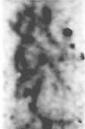○（豻）
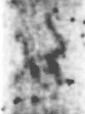加
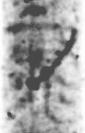彔（綠）
